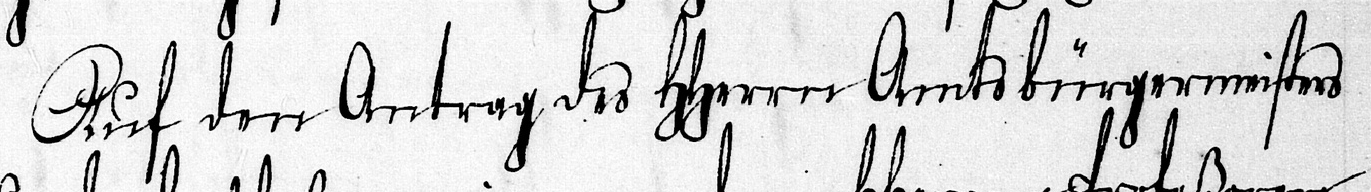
Auf den Antrag des HHerrn Amtsbürgermeisters
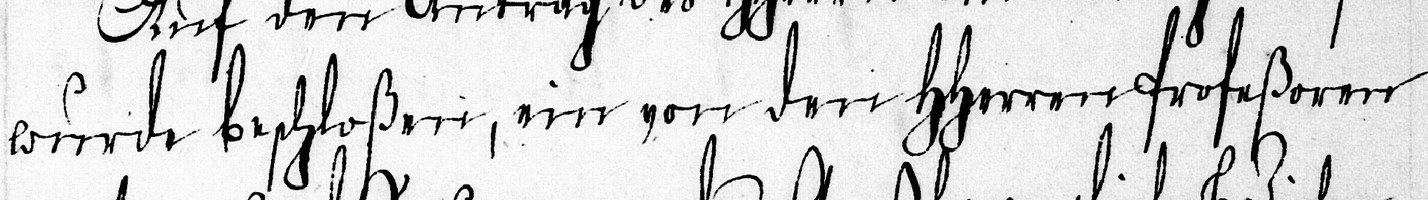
wurde beschloßen, ein von den HHerren Profeßoren
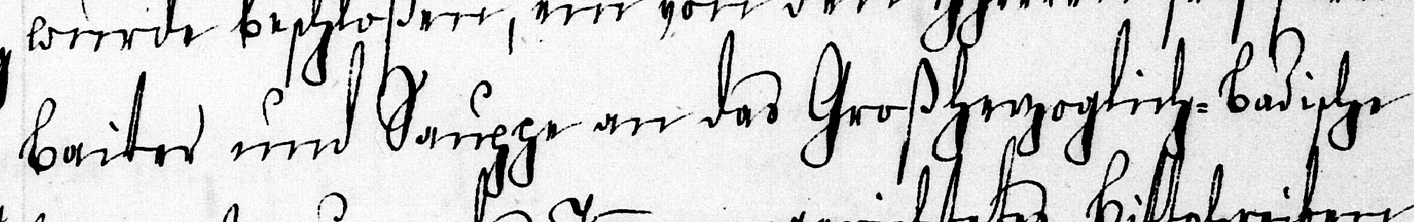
Baiter und Sauppe an das Großherzoglich-Badische
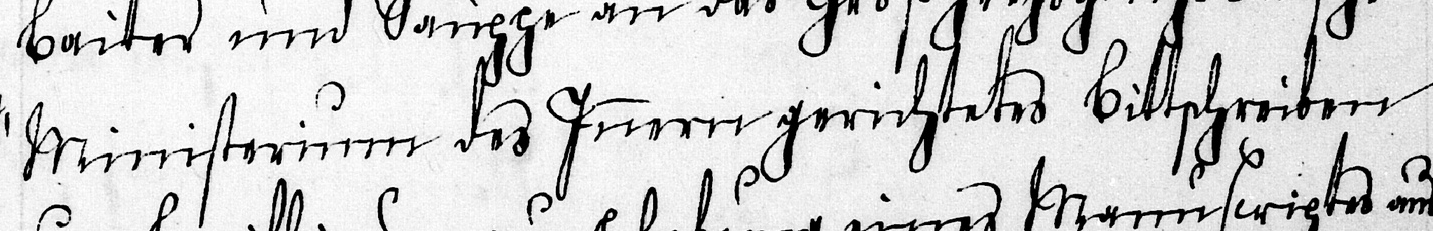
Ministerium des Innern gerichtetes Bittschreiben
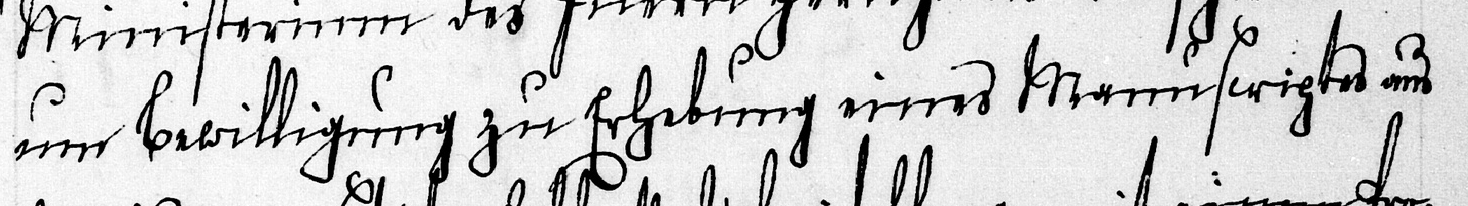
um Bewilligung zu Erhebung eines Manuscriptes aus
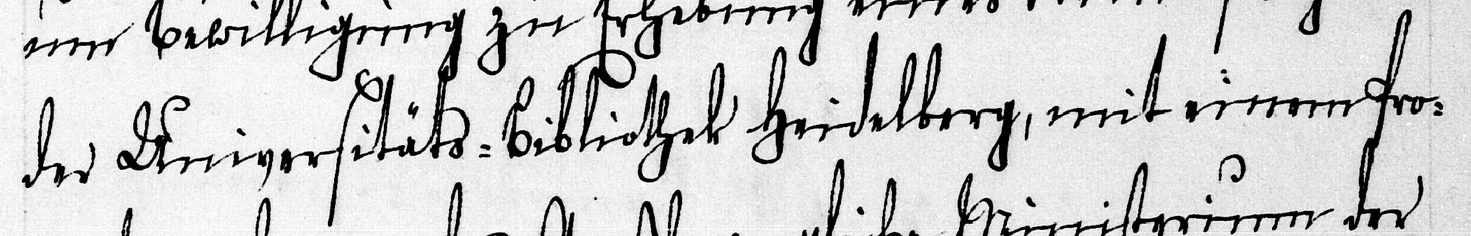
der Universitäts-Bibliothek Heidelberg, mit einem Pro¬
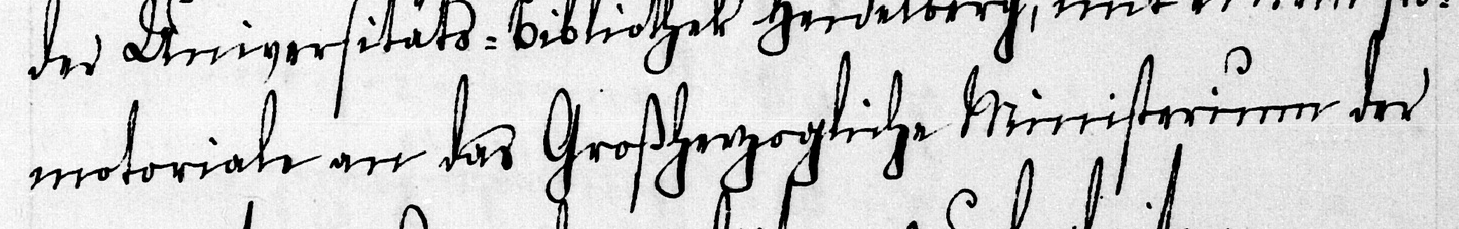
motoriale an das Großherzogliche Ministerium der
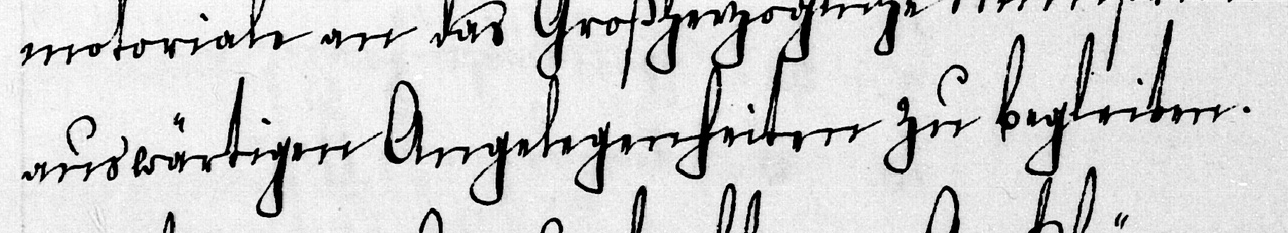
auswärtigen Angelegenheiten zu begleiten.
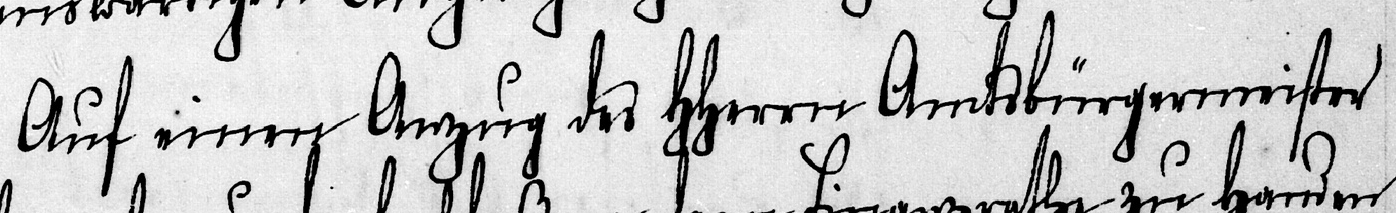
Auf einen Anzug des HHerrn Amtsbürgermeister
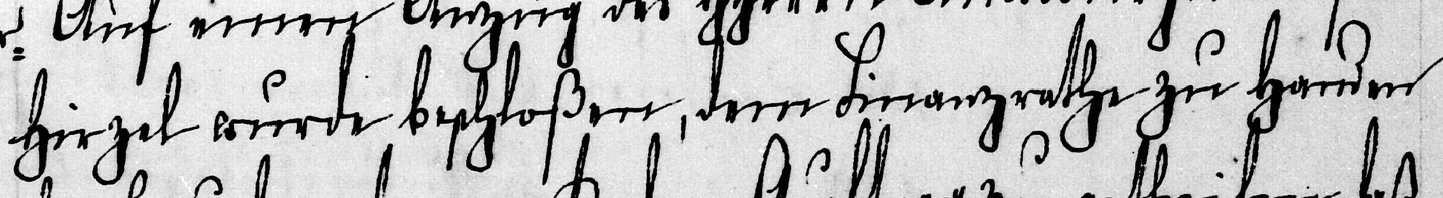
Hirzel wurde beschloßen, dem Finanzrathe zu Handen
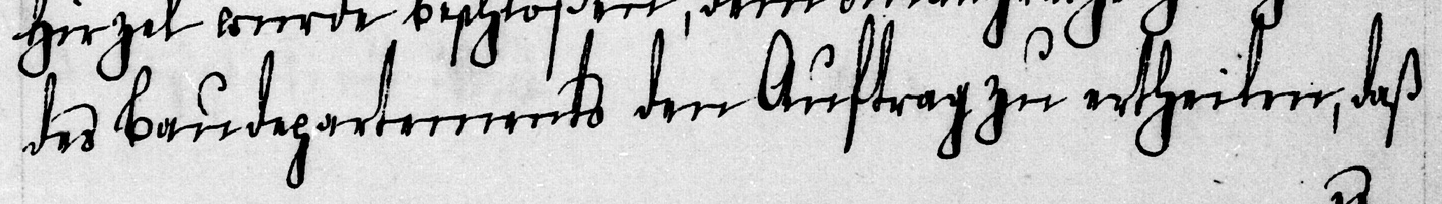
des Baudepartements den Auftrag zu ertheilen, daß
